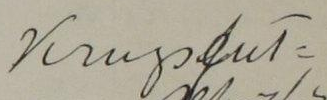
Krugsent-
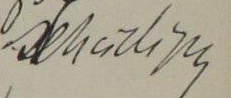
schädigung
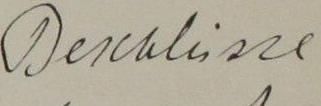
Beschlüsse
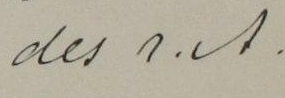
des r.A.
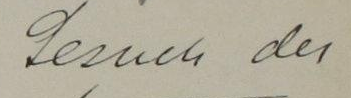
Gesuche der
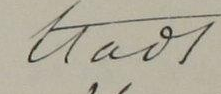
Stadt
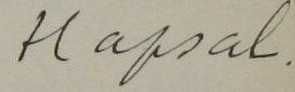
Hapsal
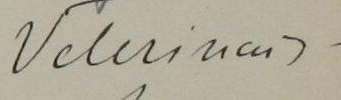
Veterinair
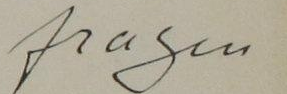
fragen
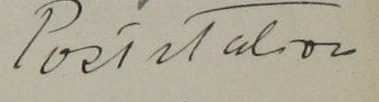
Poststation
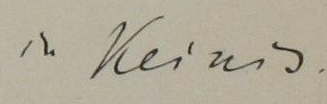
in Keinis
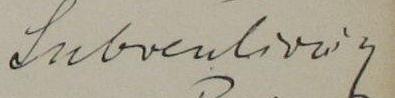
Subventionirung
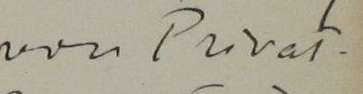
von Privat-
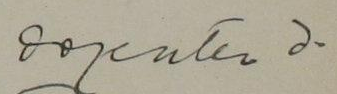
dozenten d.
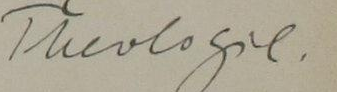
Theologie.
